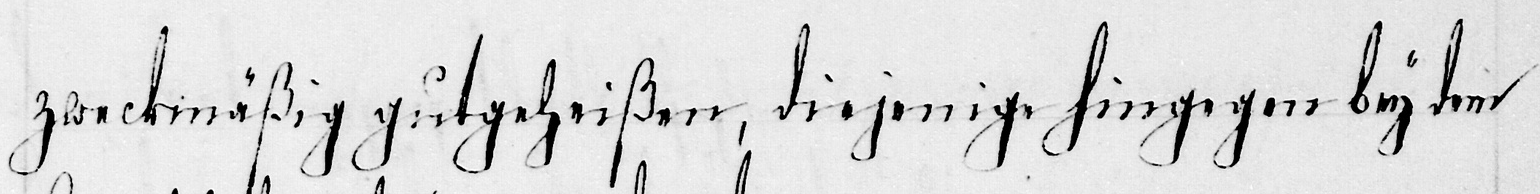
zweckmäßig gutgeheißen, diejenige hingegen bey dem
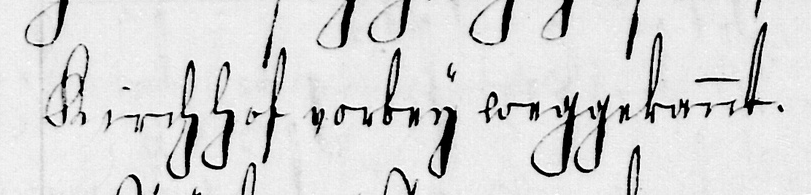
Kirchhof vorbey weggekannt.
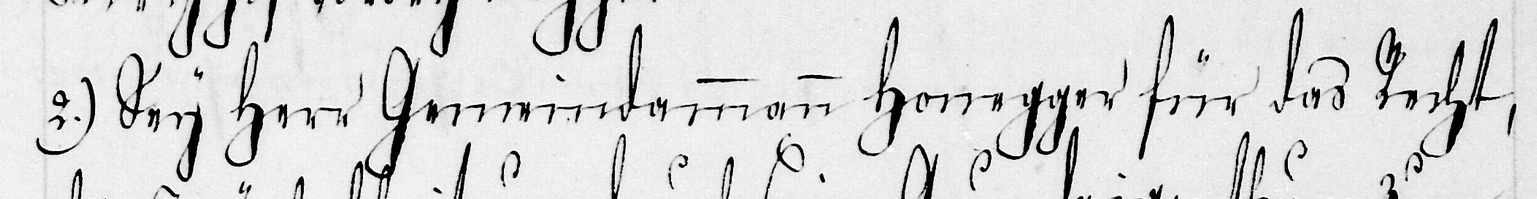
2.) Sey Herr Gemeindammann Honegger für das Recht,
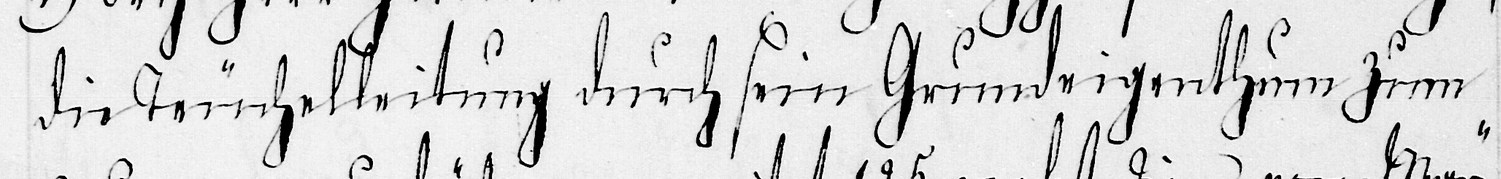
die Teuchelleitung durch sein Grundeigenthum zum
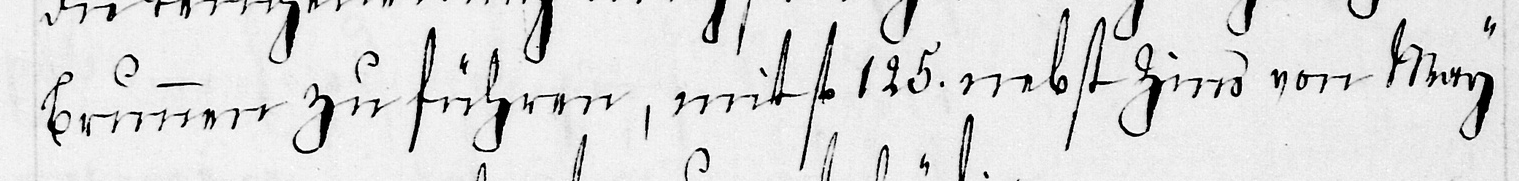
Brunnen zu führen, mit fl. 125. nebst Zins von May
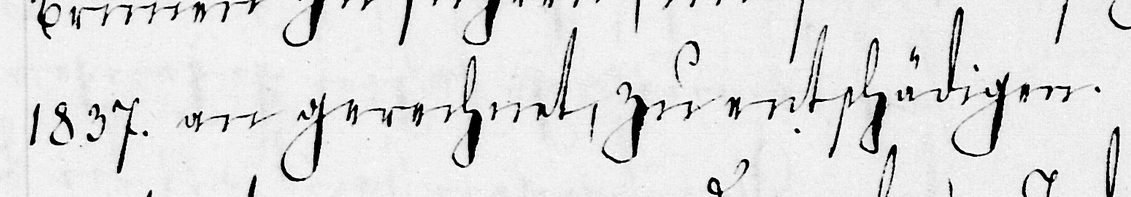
1837. an gerechnet, zu entschädigen.
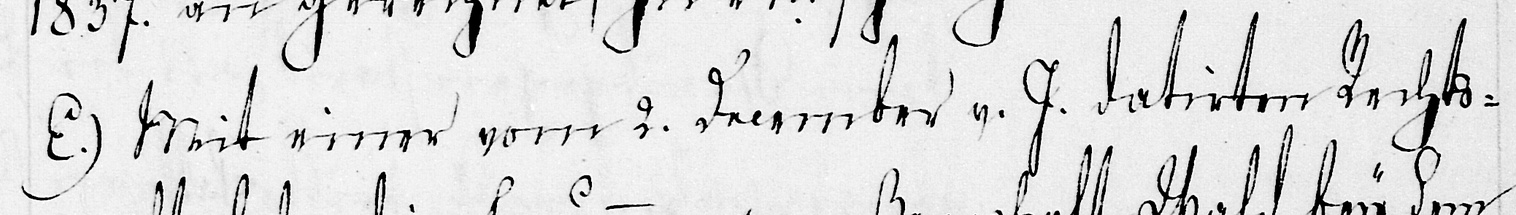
E.) Mit einer vom 2. December v. J. datirten Rechts¬
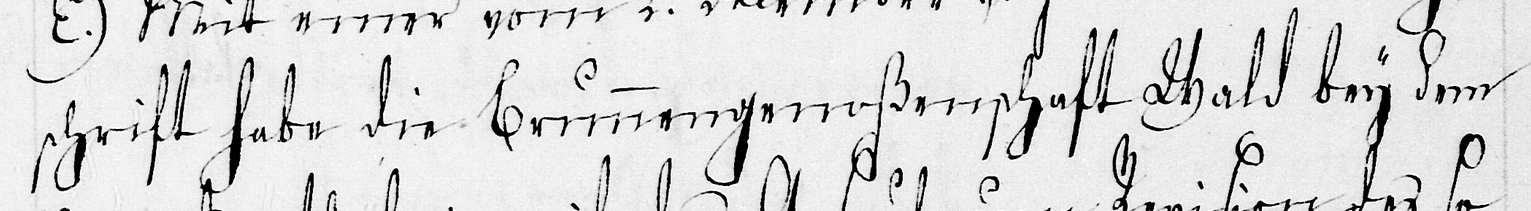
schrift habe die Brunnengenoßenschaft Wald bey dem
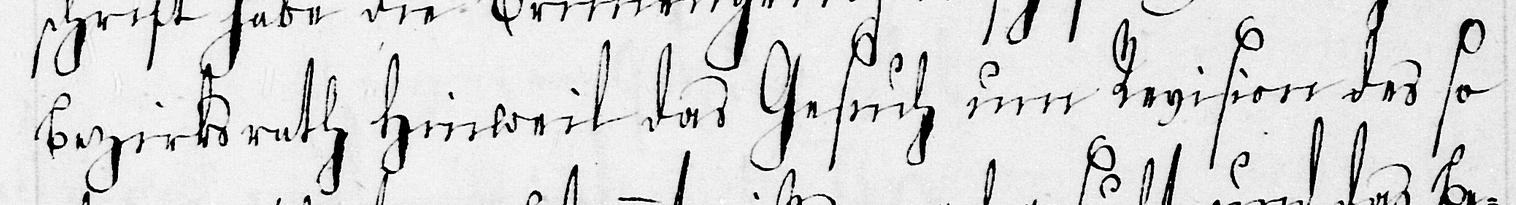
Bezirksrath Hinweil das Gesuch um Revision des so
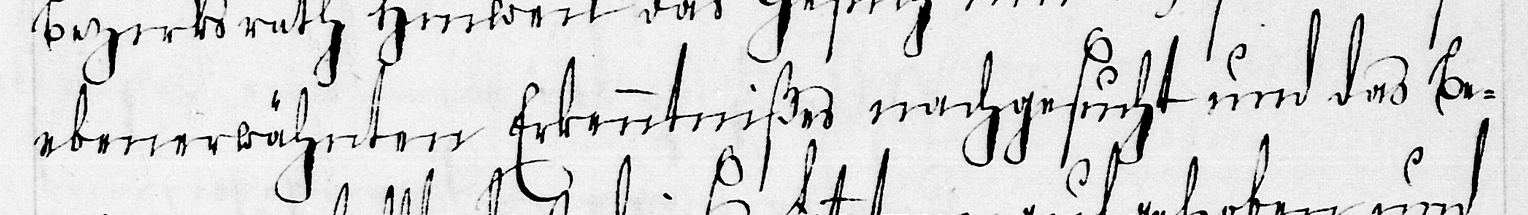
ebenerwähnten Erkenntnißes nachgesucht und das Be¬
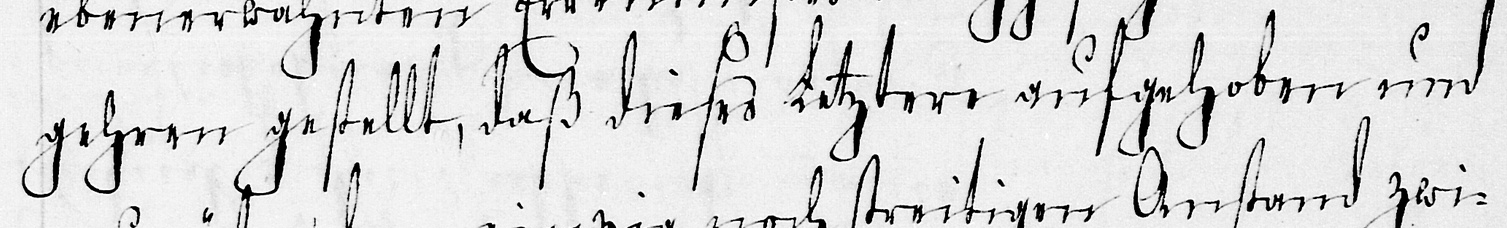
gehren gestellt, daß dieses Letztere aufgehoben und
